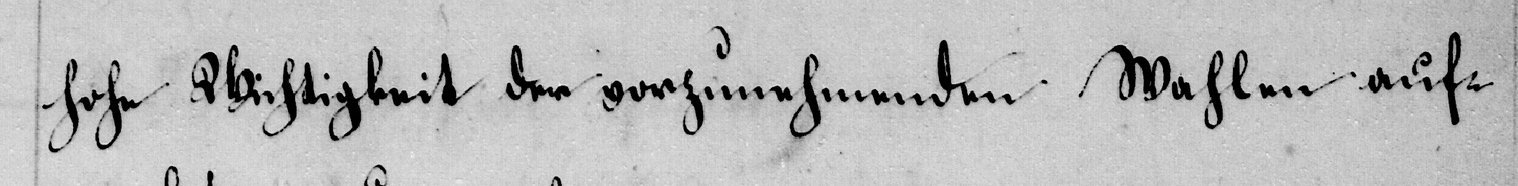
hohe Wichtigkeit der vorzunehmenden Wahlen auf¬
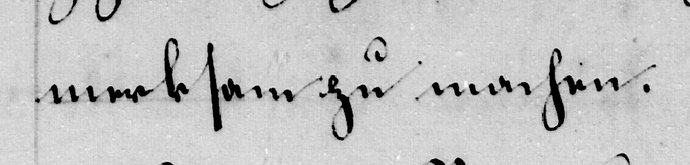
merksam zu machen.
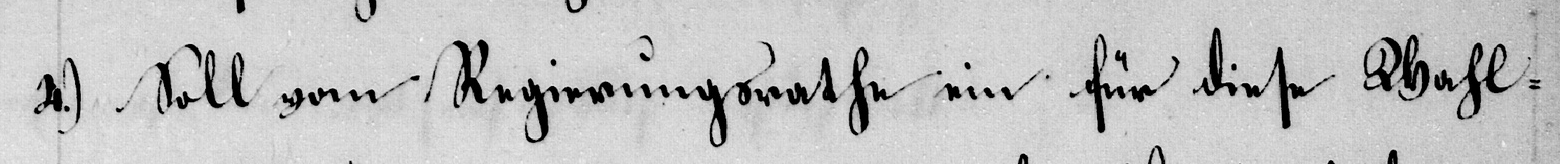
4.) Soll vom Regierungsrathe ein für diese Wahl¬
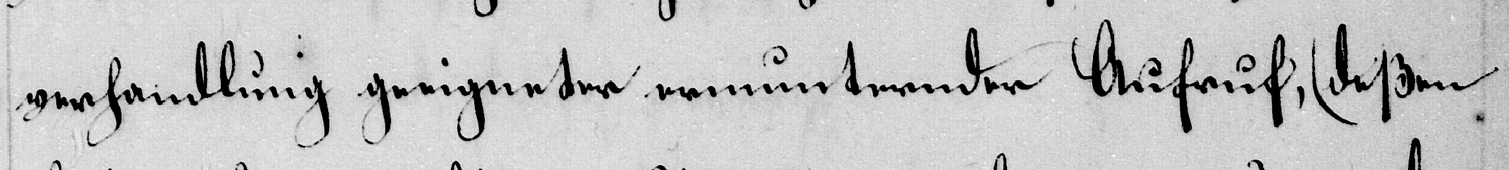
verhandlung geeigneter ermunternder Aufruf, (deßen
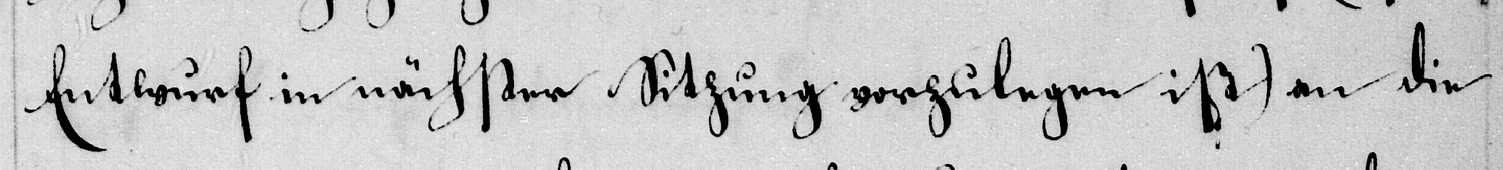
Entwurf in nächster Sitzung vorzulegen ist) an die
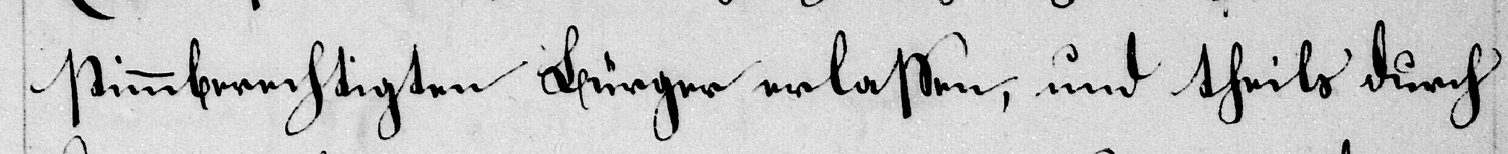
stimmberechtigten Bürger erlaßen, und theils durch
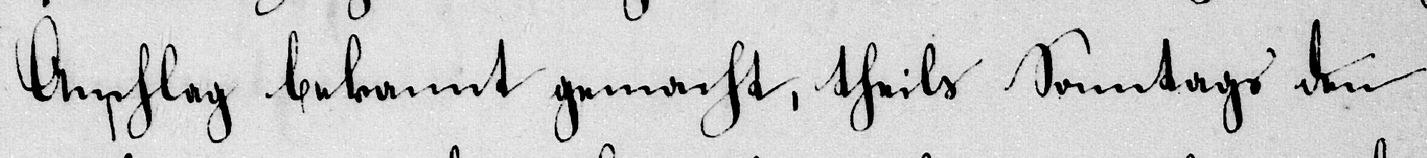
Anschlag bekannt gemacht, theils Sonntags den
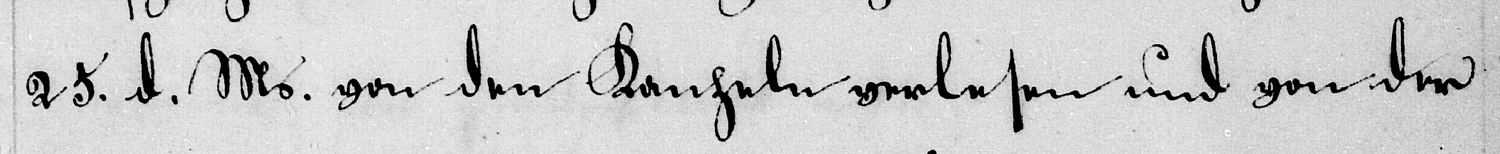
25. d. Ms. von den Kanzeln verlesen und von der
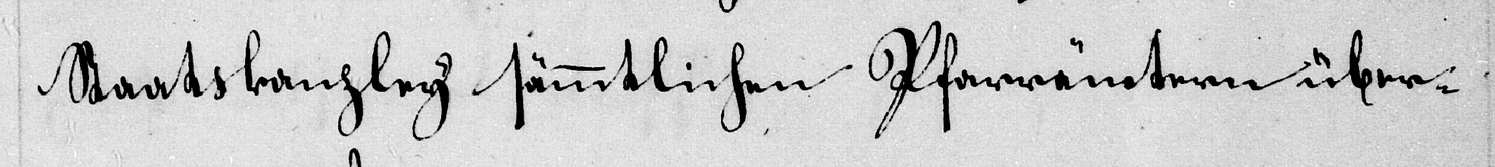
Staatskanzley sämmtlichen Pfarrämtern über¬
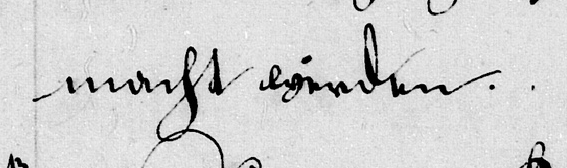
macht werden.
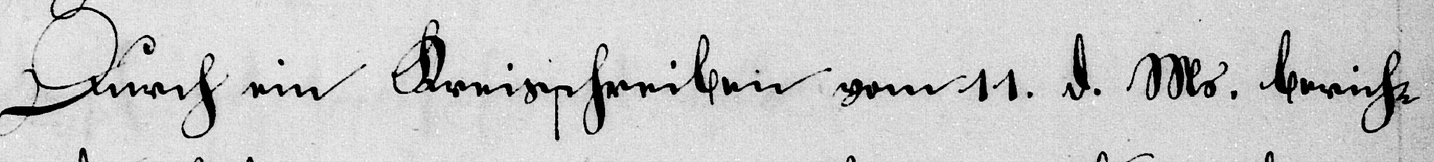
Durch ein Kreisschreiben vom 11. d. Ms. berich¬
